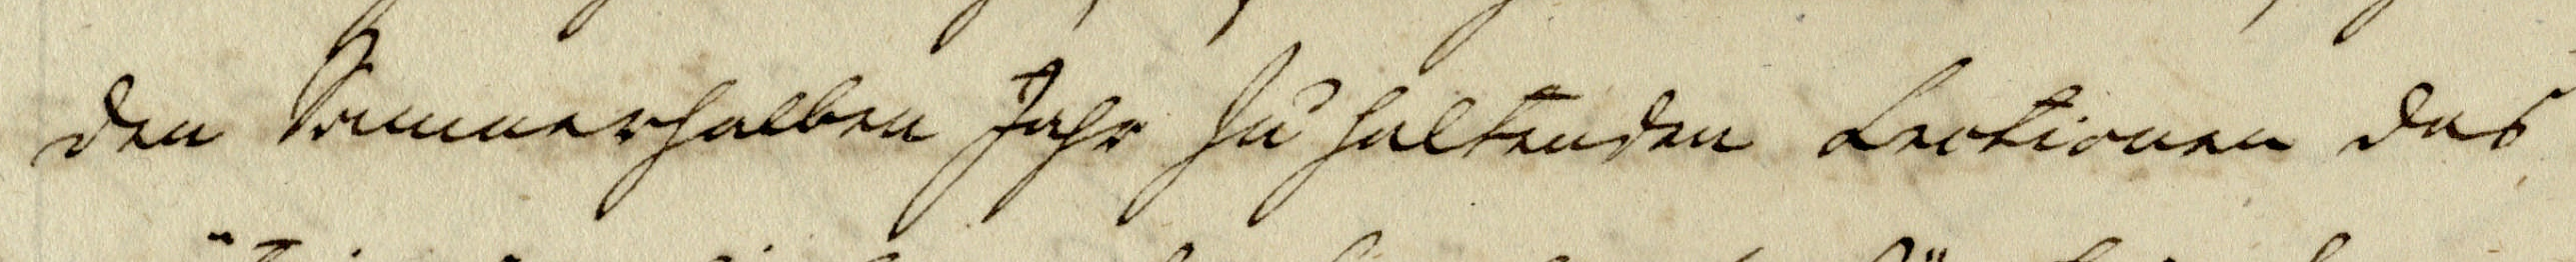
den Sommerhalben Jahr zu haltenden Lectionen das
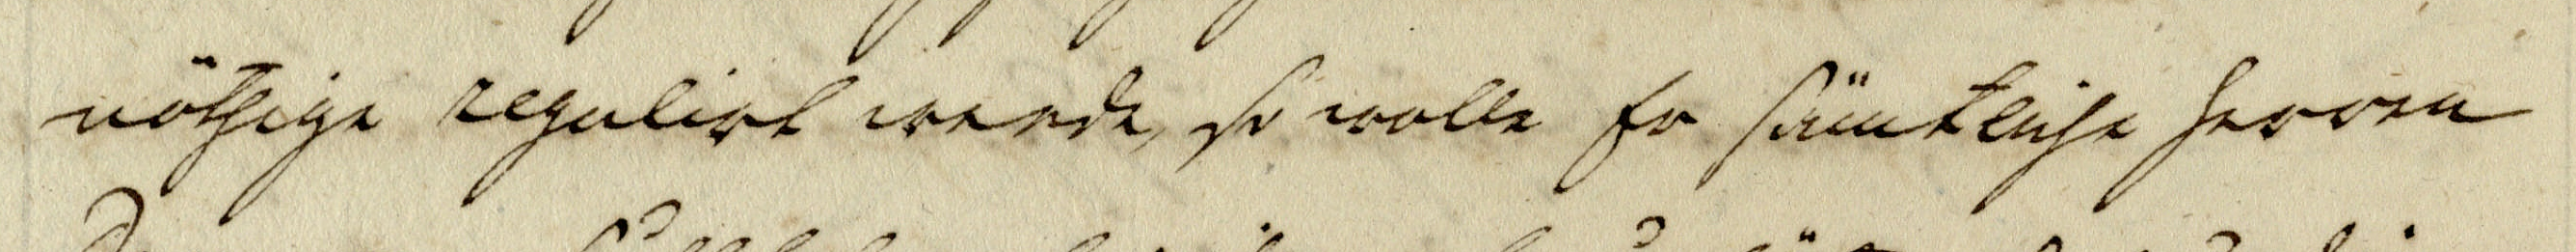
nöthige regulirt werde, so wolle Er sämtliche Herren
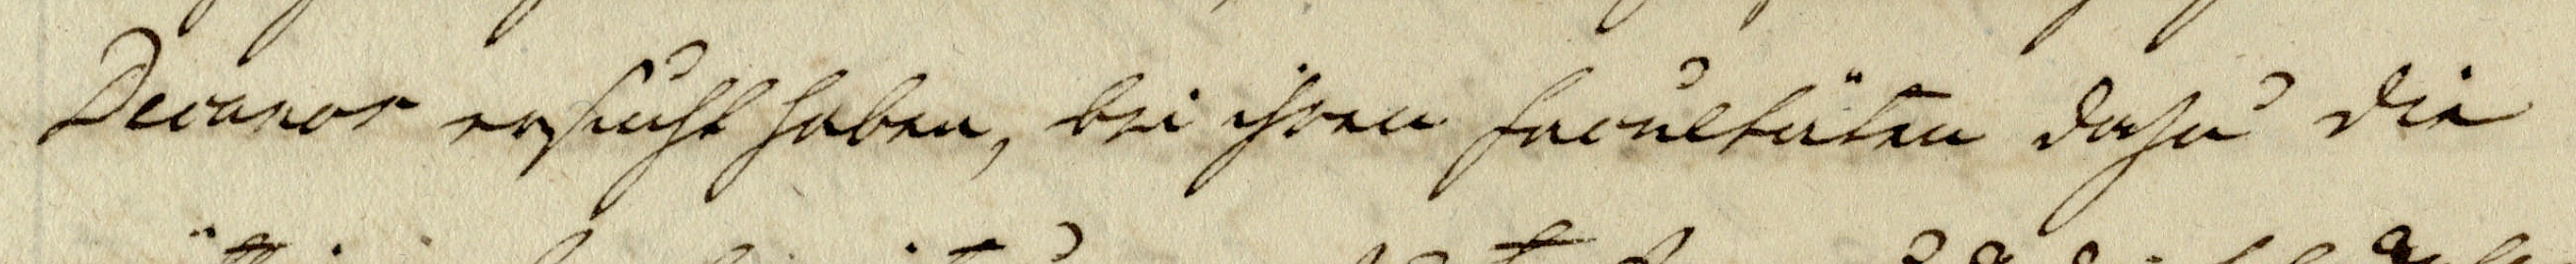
Decanos ersucht haben, bei ihren Facultäten dazu die
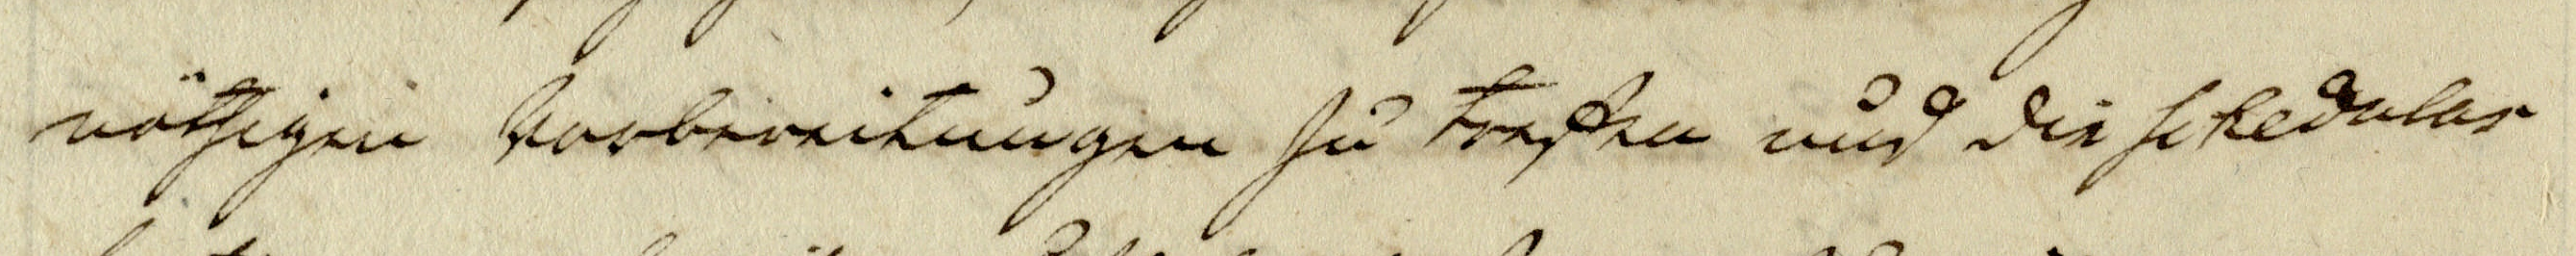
nöthigen Vorbereitungen zu treffen und die Schedulas
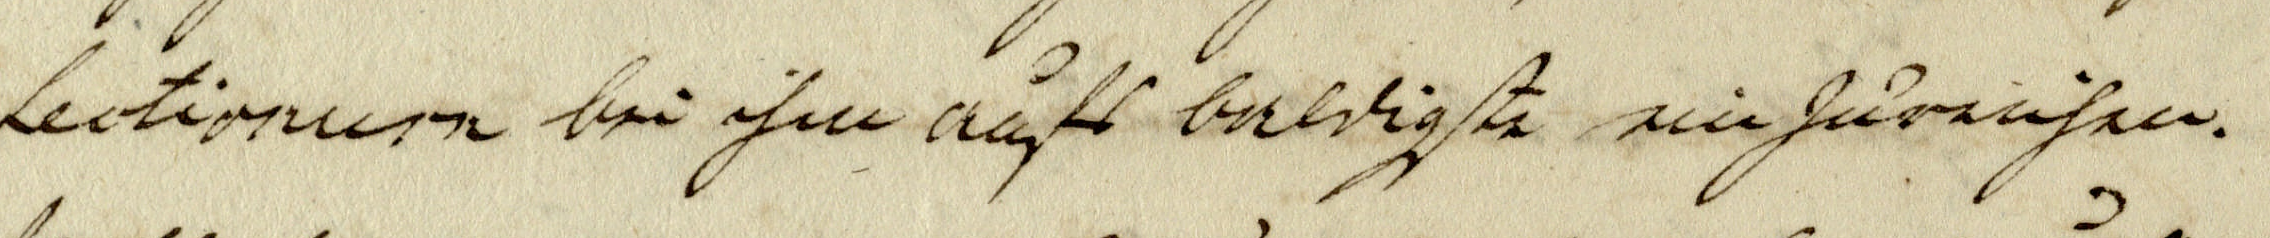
Lectionum bei ihm aufs baldigste einzureichen.
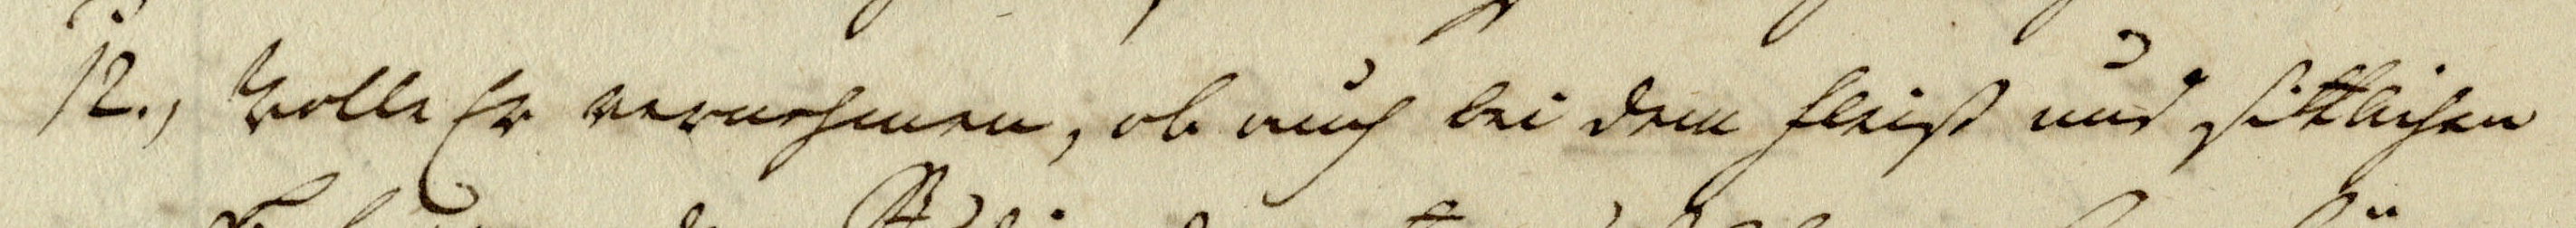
12., Wolle Er vernehmen, ob auch bei dem Fleiß und sittlichen
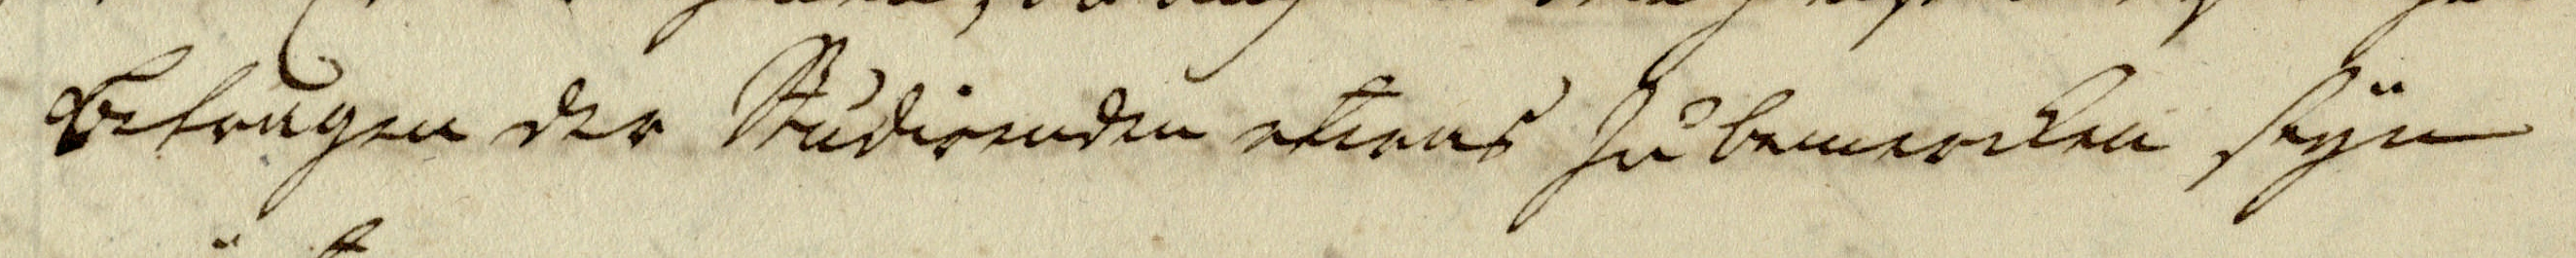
Betragen der Studirenden etwas zu bemercken seÿn
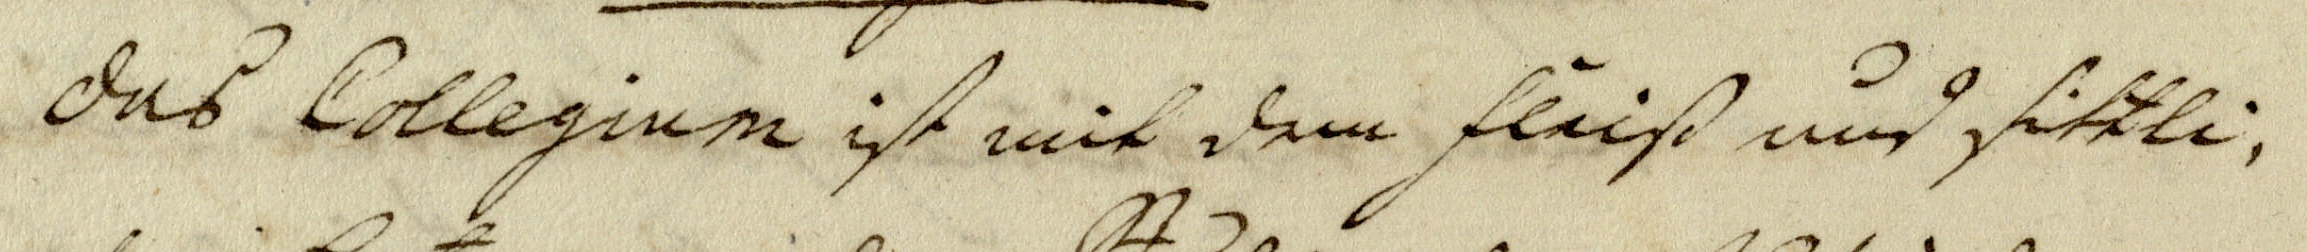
Das Collegium ist mit dem Fleiß und sittli¬
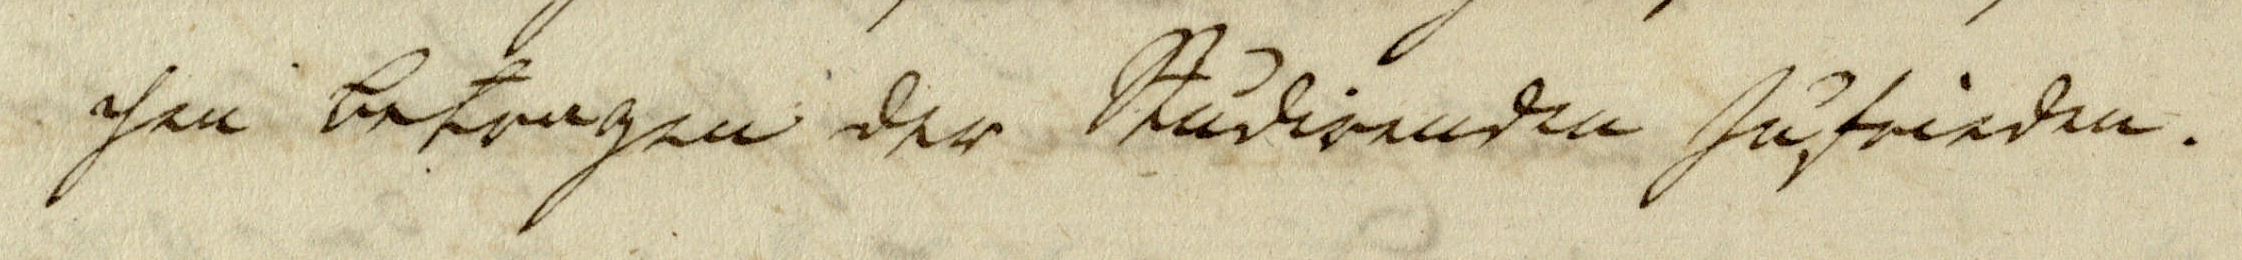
chen Betragen der Studirenden zufrieden.
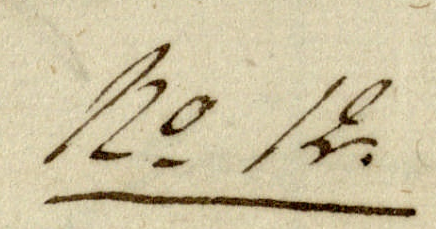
No 12.
